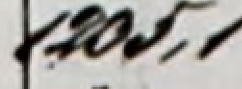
1205,1
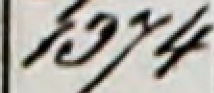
1374
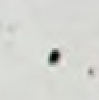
„
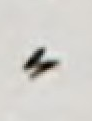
„
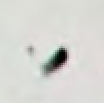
„
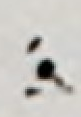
„
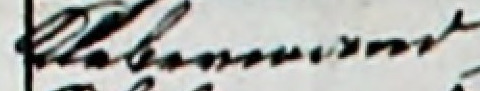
Kleberwand
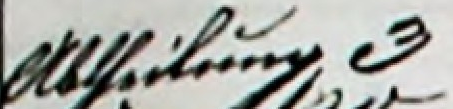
Abtheilung 3
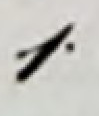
1
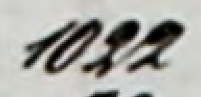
1022
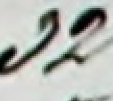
32
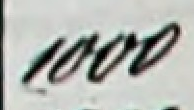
1000
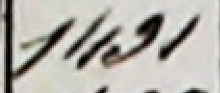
1431
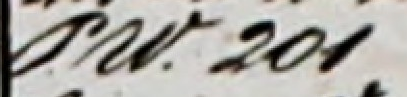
P.W. 201
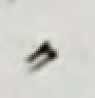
„
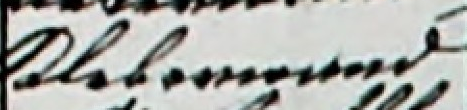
Kleberwand
